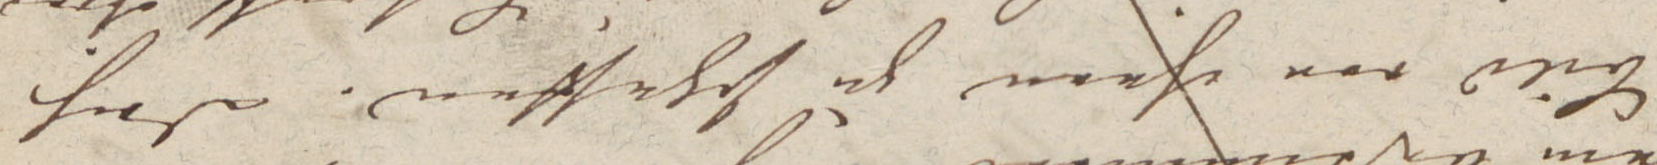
ihnen voraussetzen, was in dieser
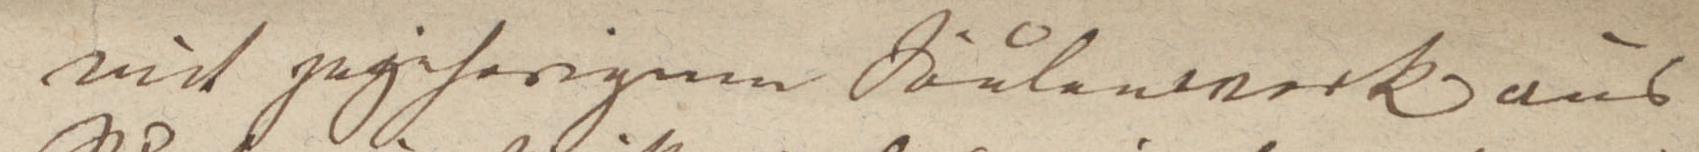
mit zugehörigem Säulenwerk aus
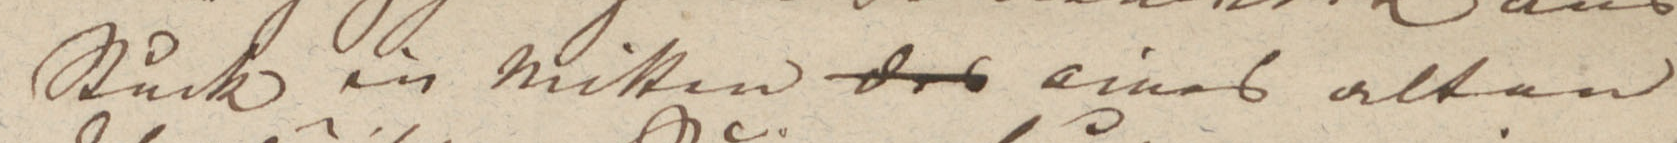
Stuck in Mitten des eines alten
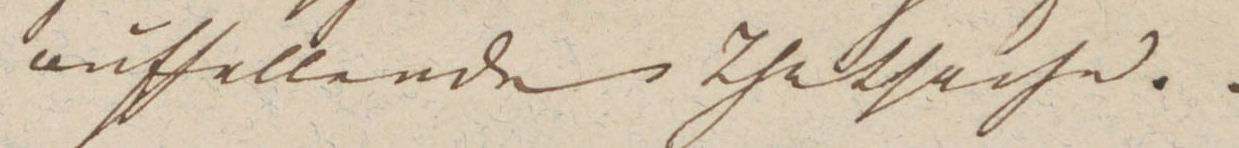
auffallende Thatsache. – .
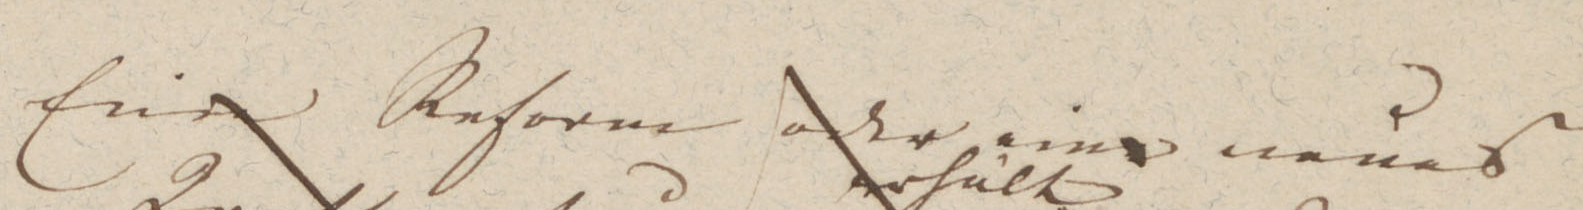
Eine Reform oder eine neues
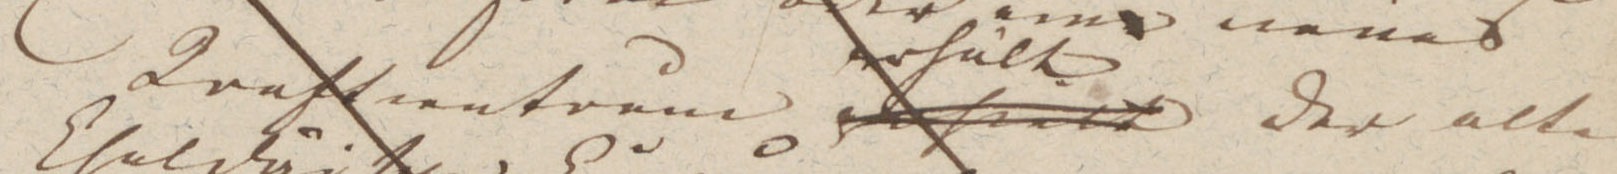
Kraftcentrum erhielt erhält der alte
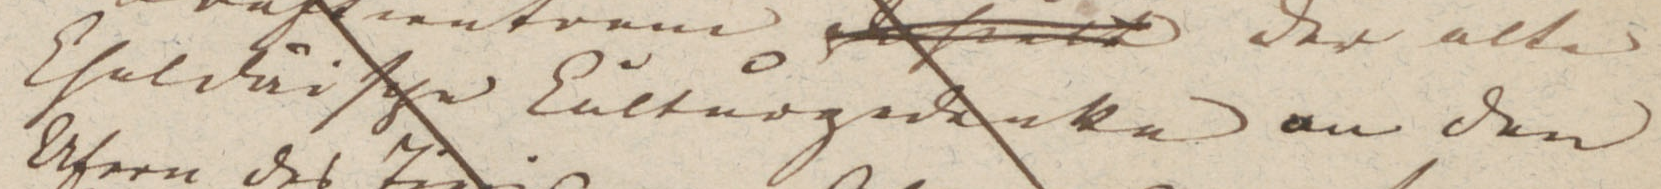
Chaldäische Culturgedanke an den
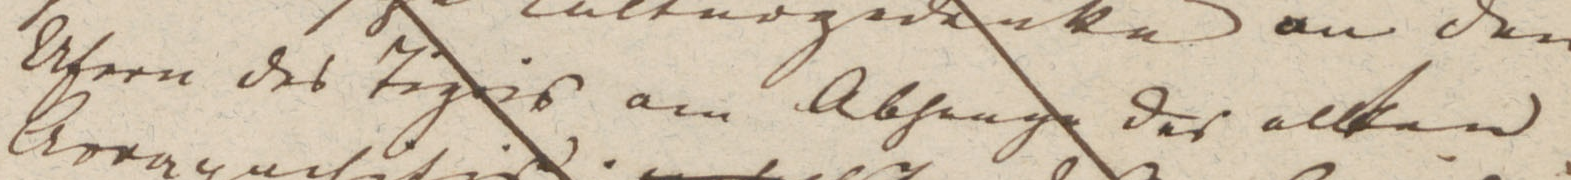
Ufern des Tigris am Abhange des alen
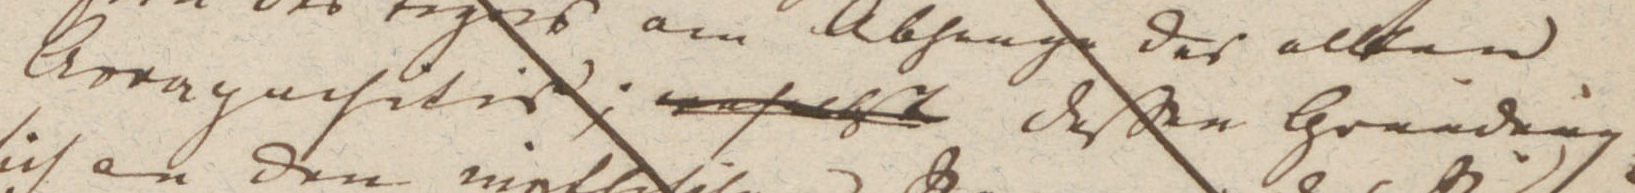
Arrapachitis; woselbst dessen Gründung
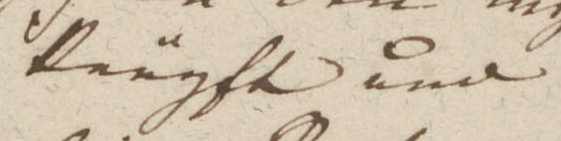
knüpft und
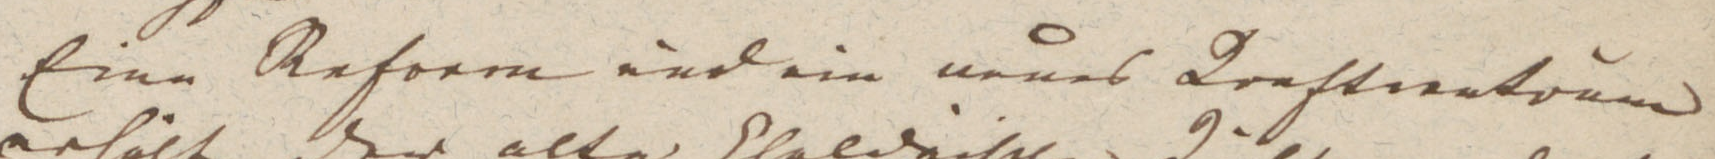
Eine Reform und ein neues Kraftcentrum
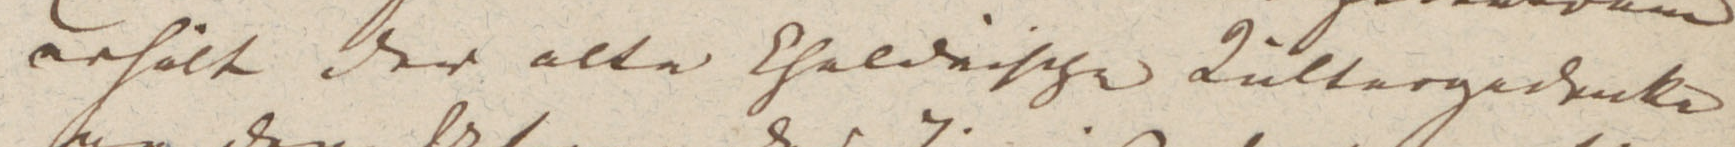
erhält der alte Chaldäische Kulturgedanke
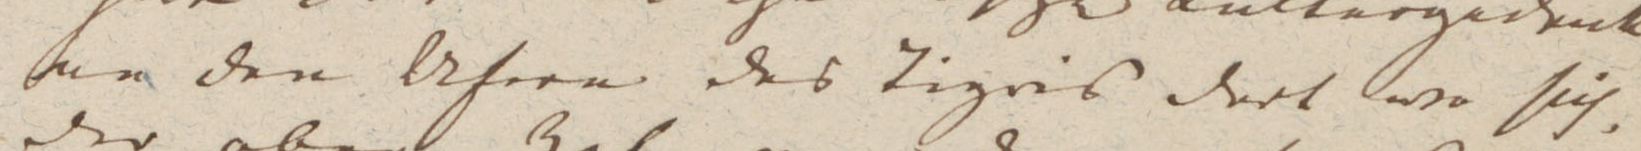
an den Ufern des Tigris dort wo sich
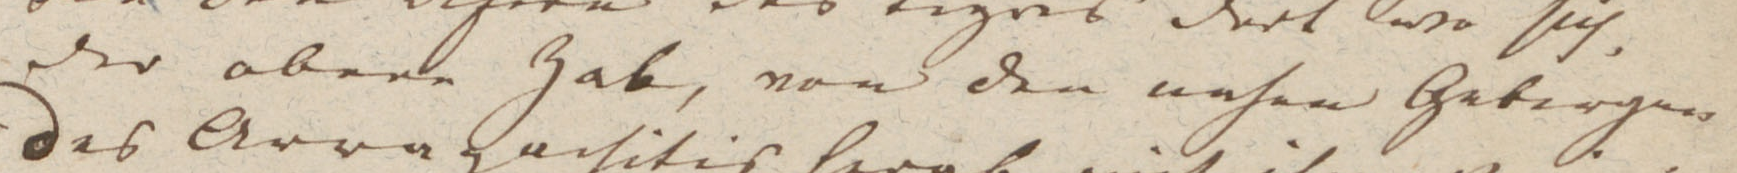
der obere Zab, von den nahen Gebirgen
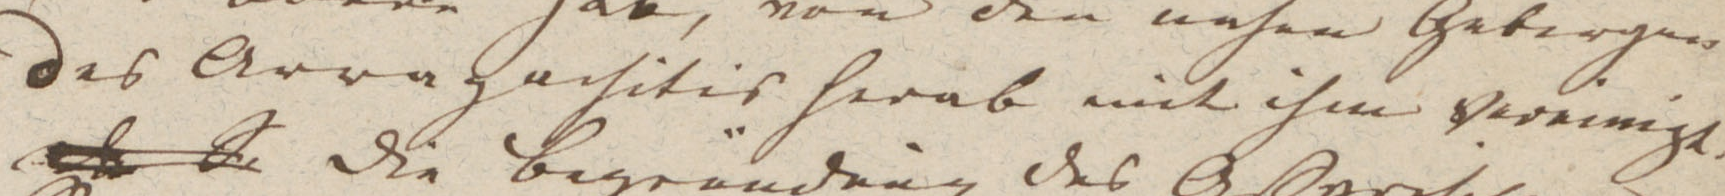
es Arrapachitis herab mit ihm vereinigt.
